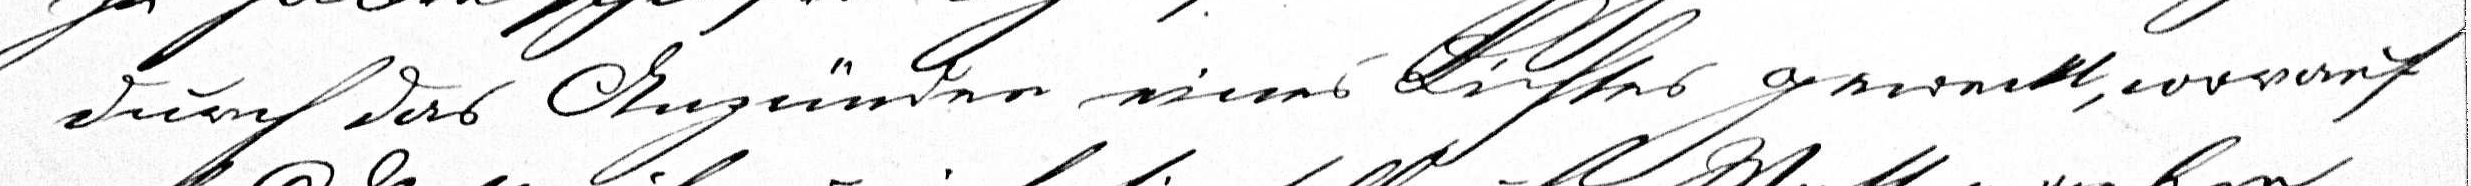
durch das Anzünden eines Lichtes geweckt, worauf
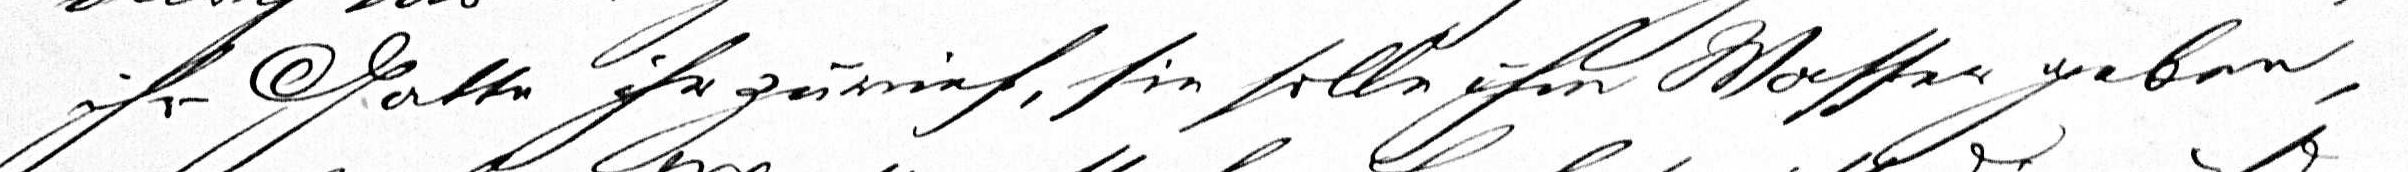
ihr Gatte ihr zurief, sie solle ihm Wasser geben,
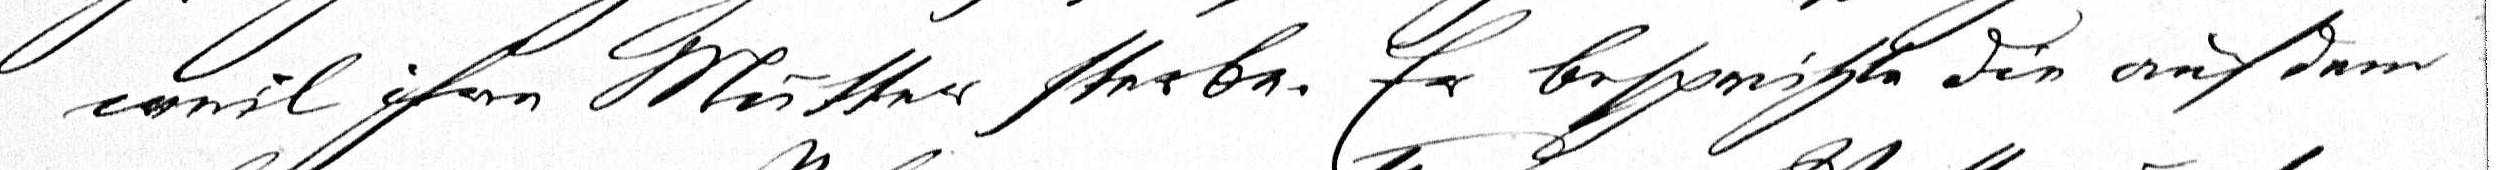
weil ihre Mutter sterbe. Er bespritzte die auf dem
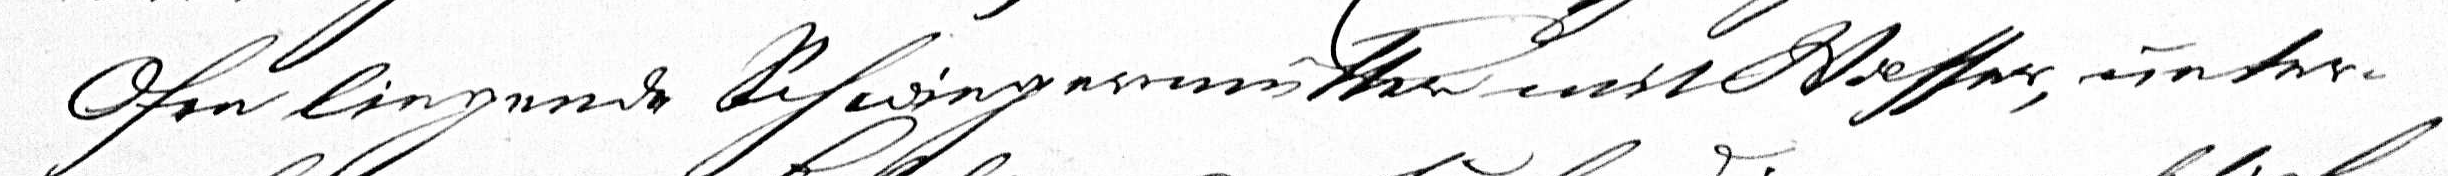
Ofen liegende Schwiegermutter mit Wasser, unter¬
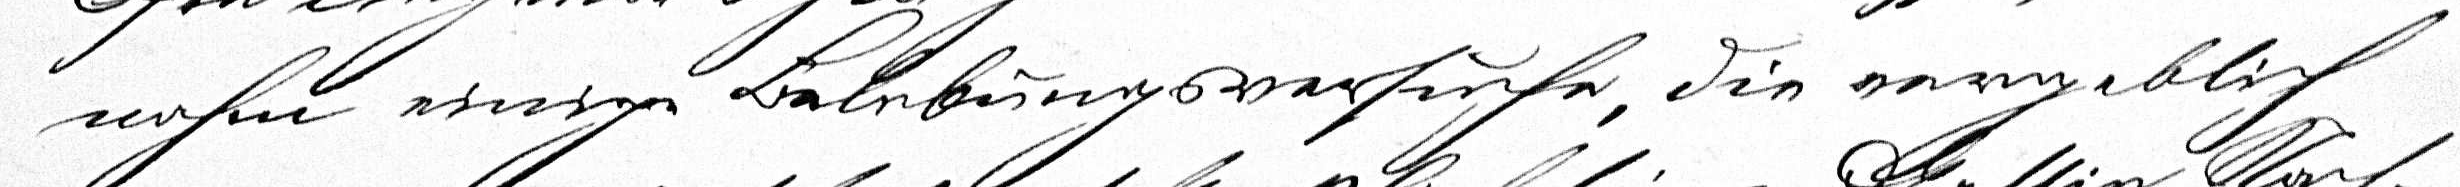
nahm einige Belebungsversuche, die vergeblich
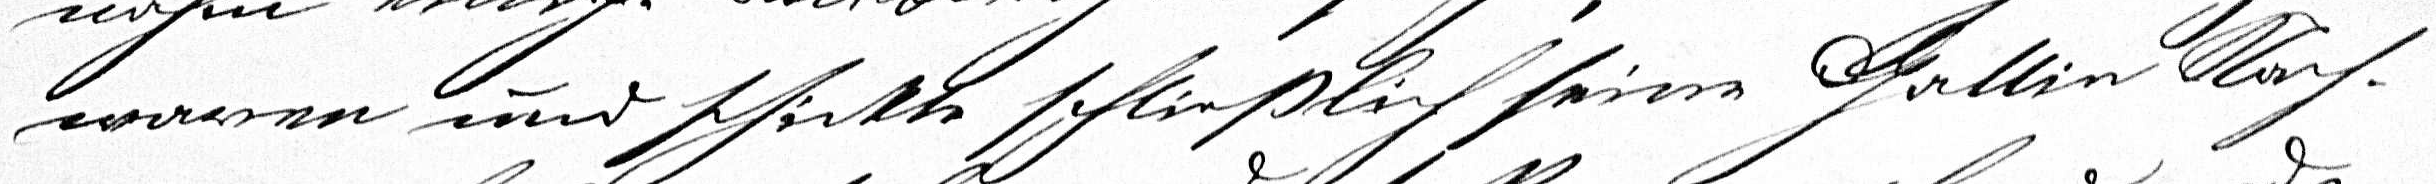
waren und schickte schließlich seine Gattin Nach¬
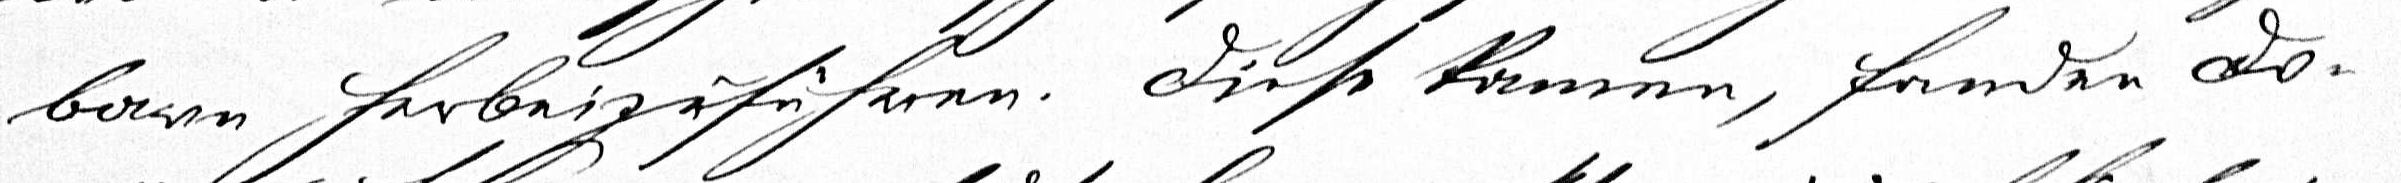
barn herbeizuführen. Diese kamen, fanden Do¬
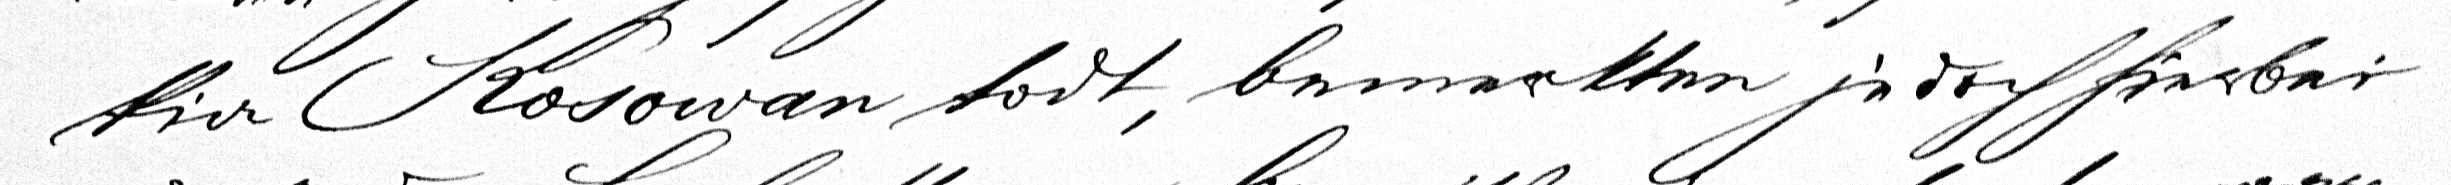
kia Kosowan todt, bemerkten, jedoch hierbei
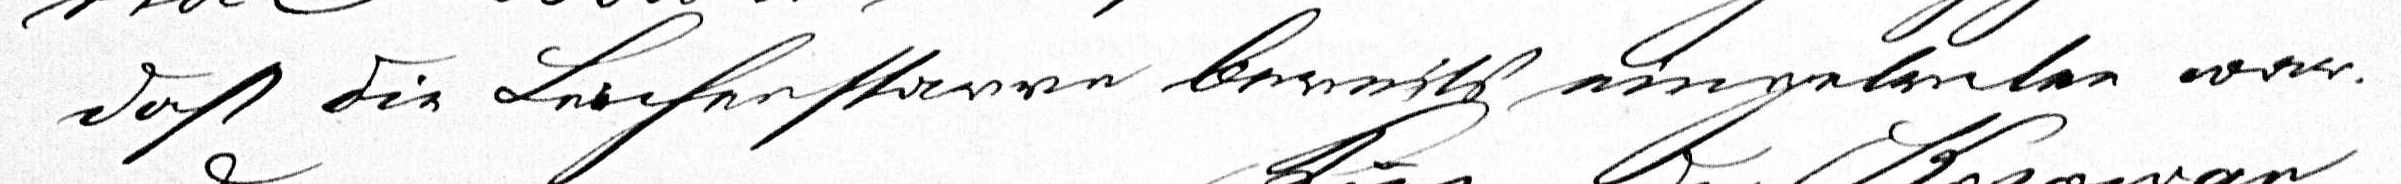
daß die Leichenstarre bereits eingetreten war.
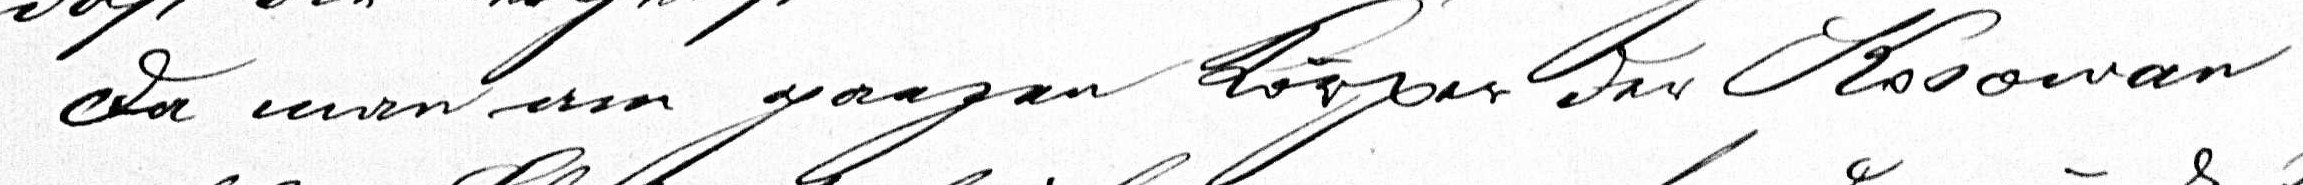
Da man am ganzen Körper der Kosowan
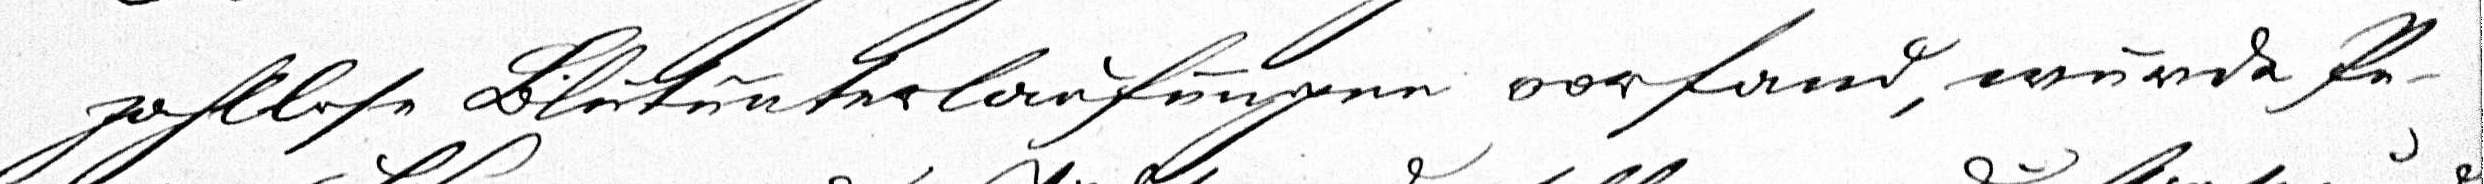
zahllose Blutunterlaufungen vorfand, wurde Pe¬
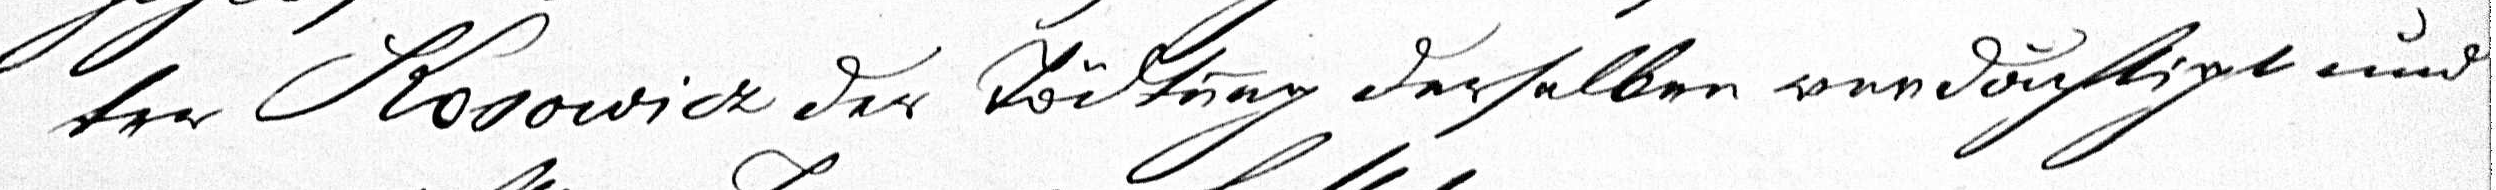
ter Kosowicz der Tödtung derselben verdächtigt und
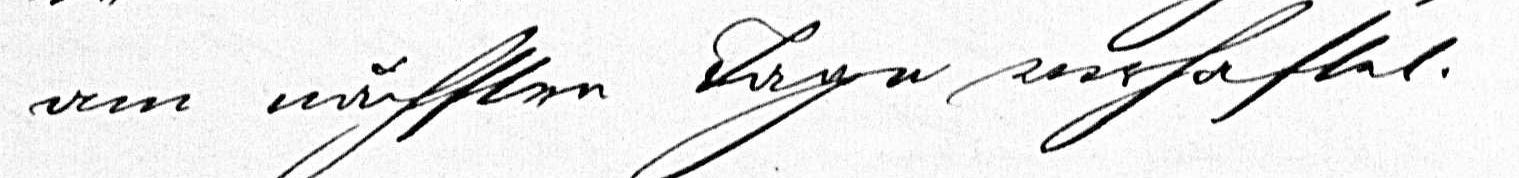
am nächsten Tage verhaftet.
